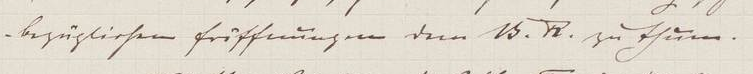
bezüglichen Eröffnungen dem B.R. zu thun.
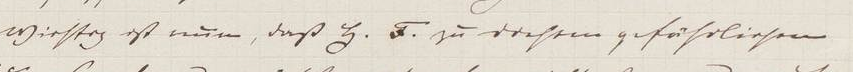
Wichtig ist nun, daß H. F. zu diesem gefährlichen
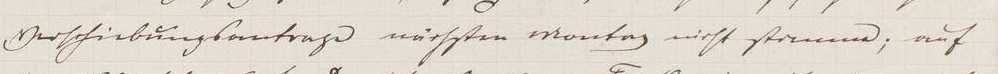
Verschiebungsantrage nächsten Montag nicht stimme; auf
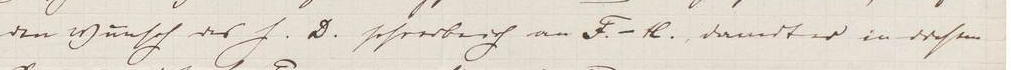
den Wunsch des H. D. schreibe ich an F.-H. damit er in diesem
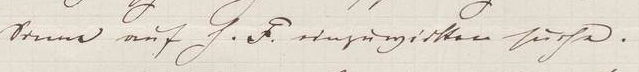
Sinne auf H. F. einzuwirken suche.
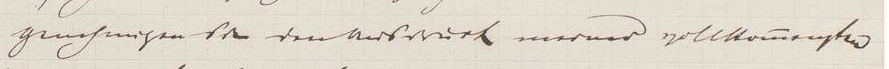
Genehmigen Sie den Ausdruck meiner vollkommensten
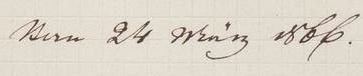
Bern, 24 März 1866.
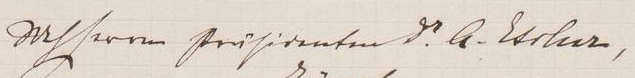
MHHerrn Präsidenten Dr A. Escher,
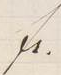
fr.
